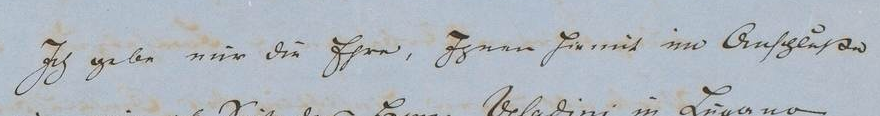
Ich gebe mir die Ehre, Ihnen hiemit im Anschluße
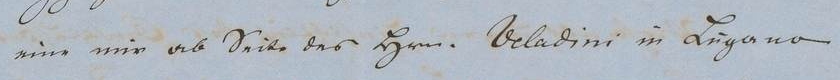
eine mir ab Seite des Hrn. Veladini in Lugano
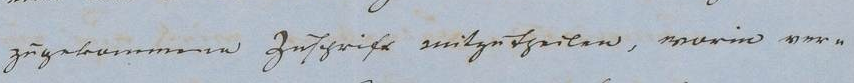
zugekommene Zuschrift mitzutheilen, worin ver-
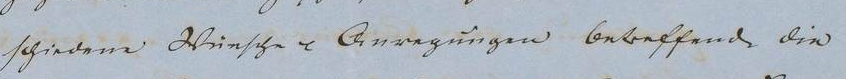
schiedene Wünsche & Anregungen betreffend die
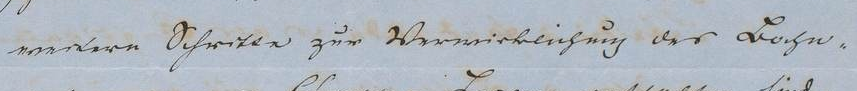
weitern Schritte zur Verwirklichung des Bahn-
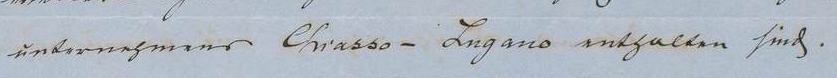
unternehmens Chiasso–Lugano enthalten sind.
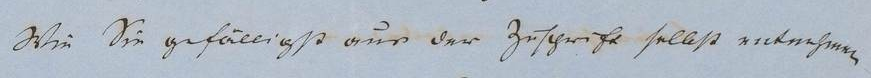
Wie Sie gefälligst aus der Zuschrift selbst entnehmen
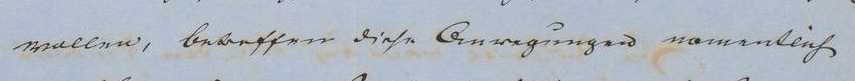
wollen, betreffen diese Anregungen namentlich
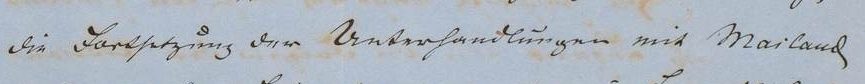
die Fortsetzung der Unterhandlungen mit Mailand
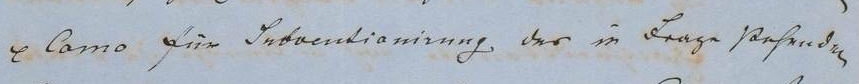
& Como für Subventionirung des in Frage stehenden
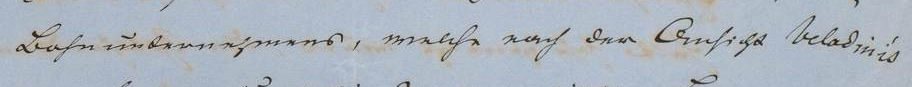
Bahnunternehmens, welche nach der Ansicht Veladini's
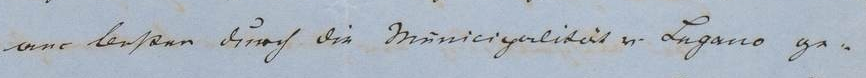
am besten durch die Municipalität v. Lugano ge-
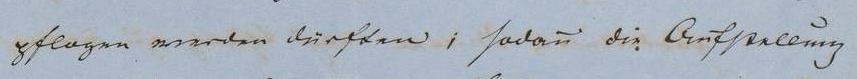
pflogen werden dürften; sodann die Aufstellung
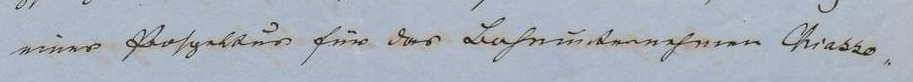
eines Prospektus für das Bahnunternehmen Chiasso–
